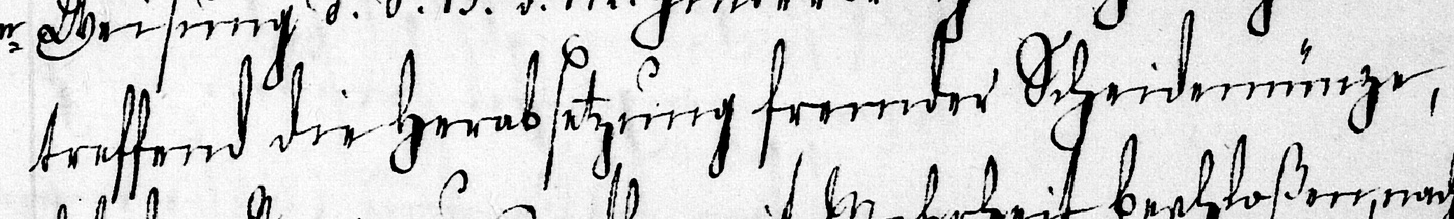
treffend die Herabsetzung fremder Scheidemünze,
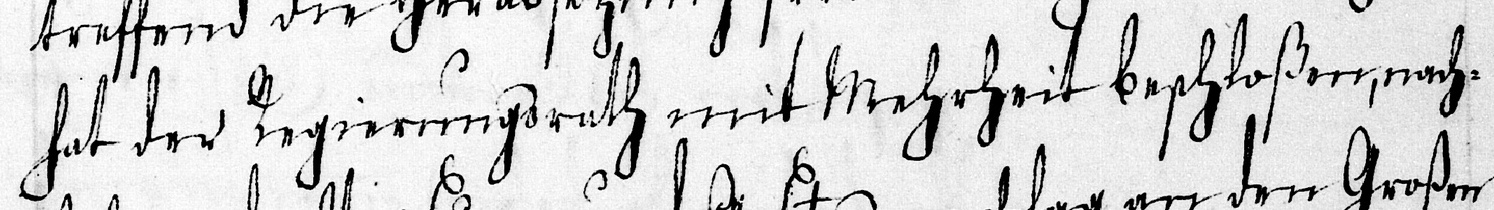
hat der Regierungsrath mit Mehrheit beschloßen, nach¬
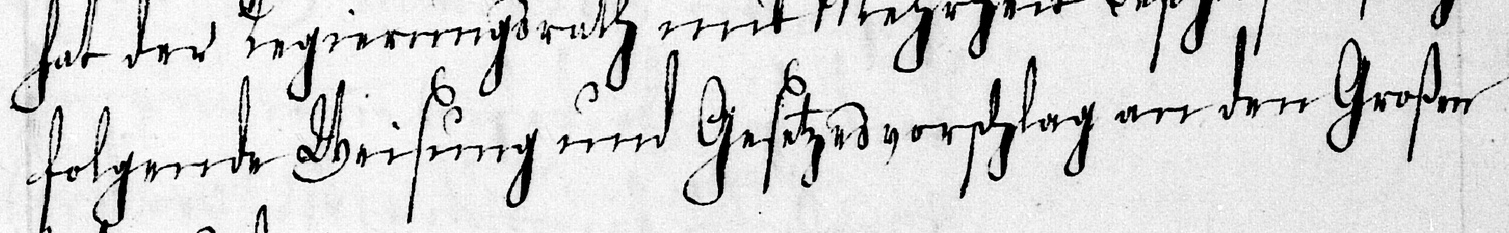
folgende Weisung und Gesetzesvorschlag an den Großen
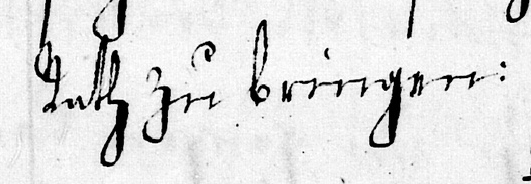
Rath zu bringen:
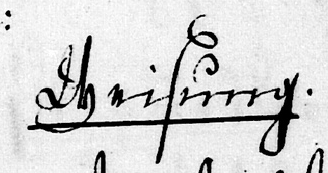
Weisung.
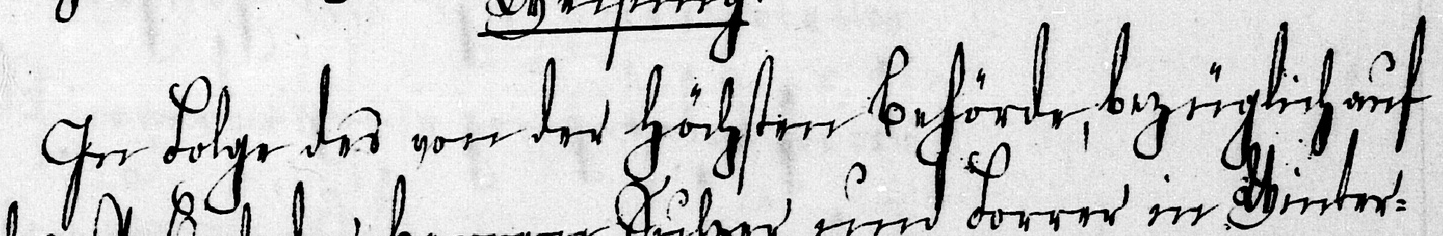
In Folge des von der Höchsten Behörde bezüglich auf
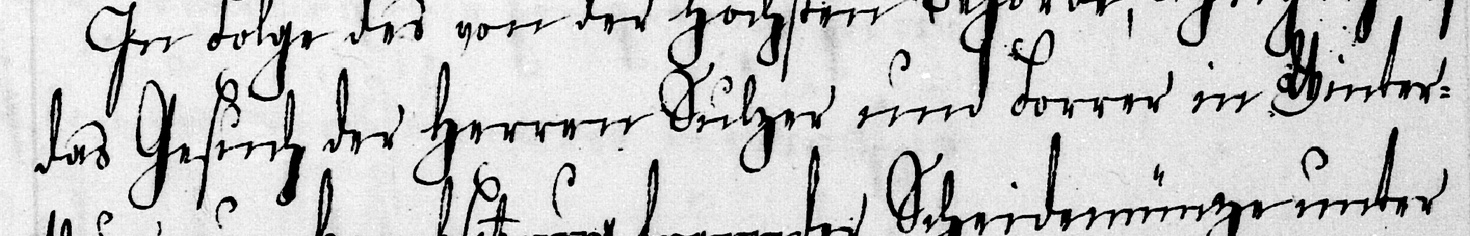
das Gesuch der Herren Sulzer und Forrer in Winter¬
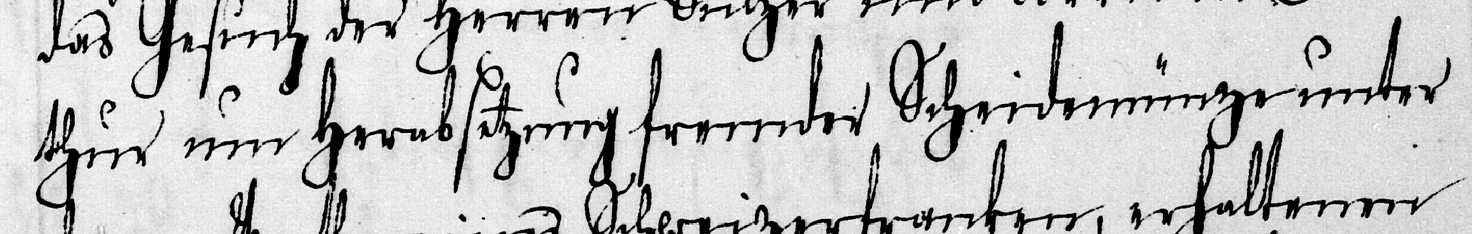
thur um Herabsetzung fremder Scheidemünze unter
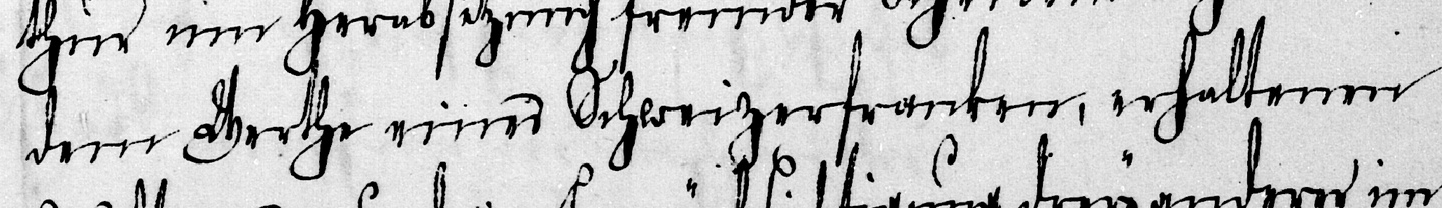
dem Werthe eines Schweizerfranken, erhaltenen
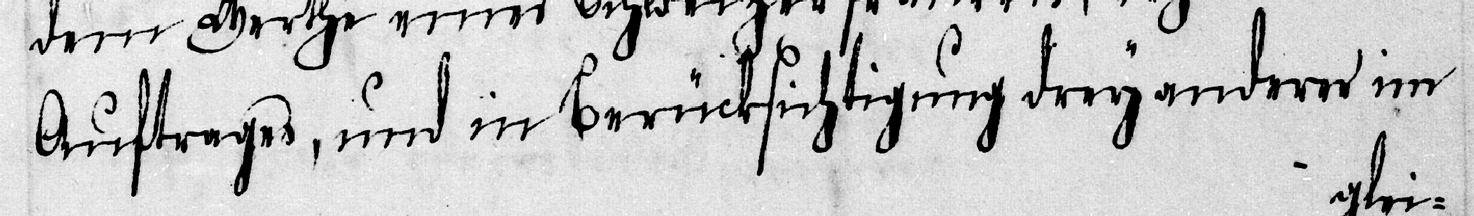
Auftrages, und in Berücksichtigung drey anderer im
